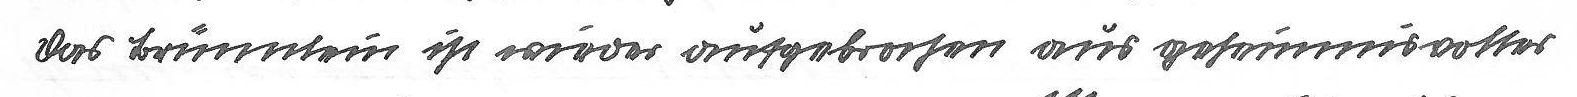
Das Brünnlein ist wieder aufgebrochen aus geheimnisvoller
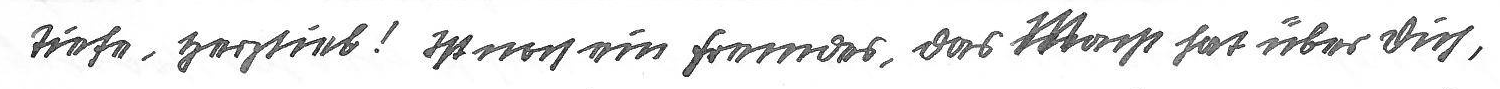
Tiefe, Herzlieb! Ist noch ein fremdes, das Macht hat über Dich,
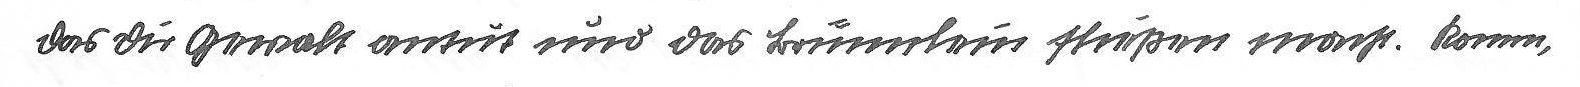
das Dir Gewalt antut und das Brünnlein fließen macht. Komm,
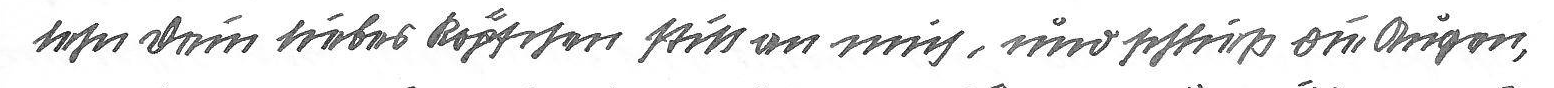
lehn Dein liebes Köpfchen still an mich, und schließ die Augen,
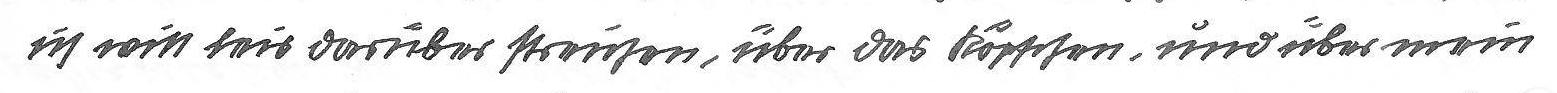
ich will leis darüber streichen, über das Köpfchen, und über mein
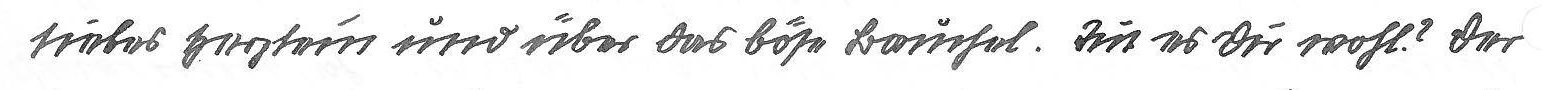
liebes Herzlein und über das böse Bauchel. Tut es Dir wohl? Der
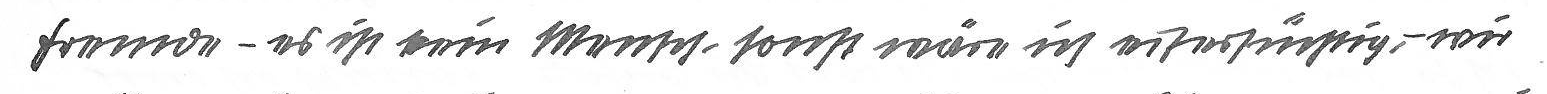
Fremde – es ist kein Mensch, sonst wäre ich eifersüchtig, – wir
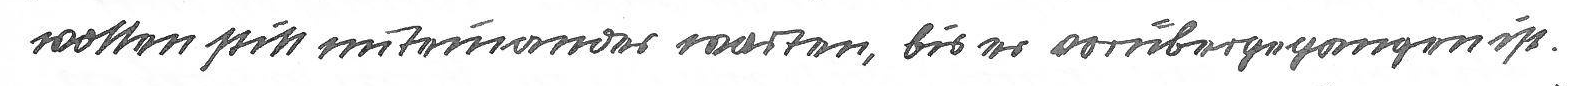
wollen still miteinander warten, bis es vorübergegangen ist.
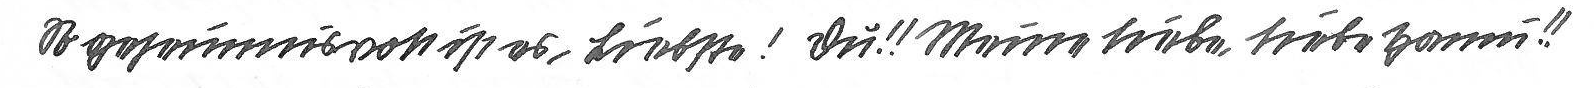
So geheimnisvoll ist es, Liebste! Du!! Meine liebe, liebe!!
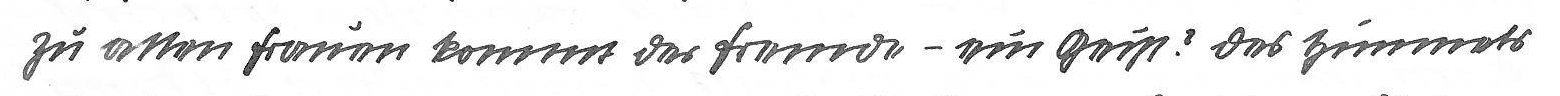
Zu allen Frauen kommt der Fremde – ein Geist? Des Himmels
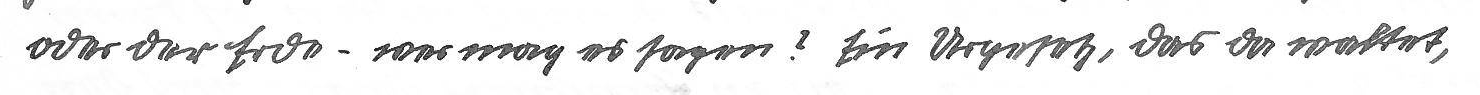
oder der Erde – wer mag es sagen? Ein Urgesetz, das da waltet,
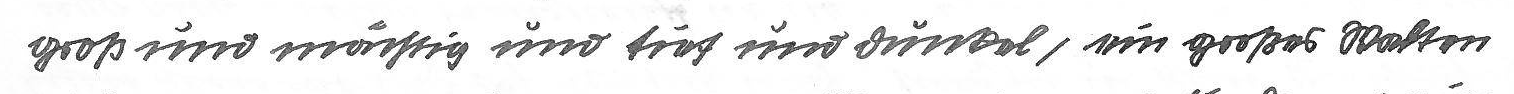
groß und mächtig und tief und dunkel / ein großes Walten
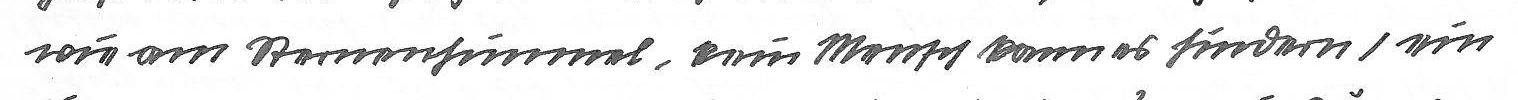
wie am Sternenhimmel, kein Mensch kann es hindern / ein
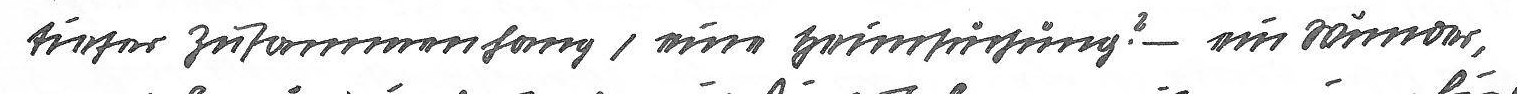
tiefer Zusammenhang / eine Heimsuchung? — ein Wunder,
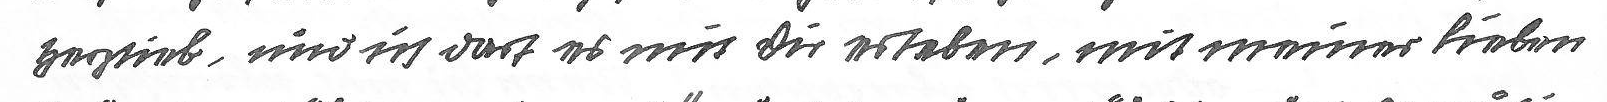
Herzlieb, und ich darf es mit Dir erleben, mit meiner lieben
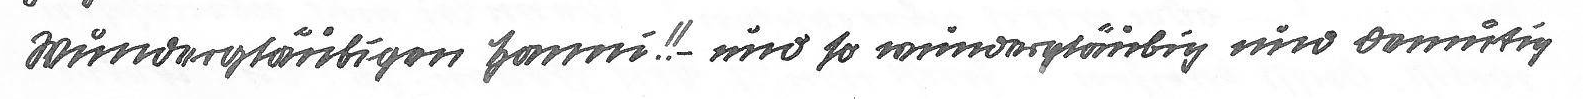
Wundergläubigen!! – und so wundergläubig und demütig
